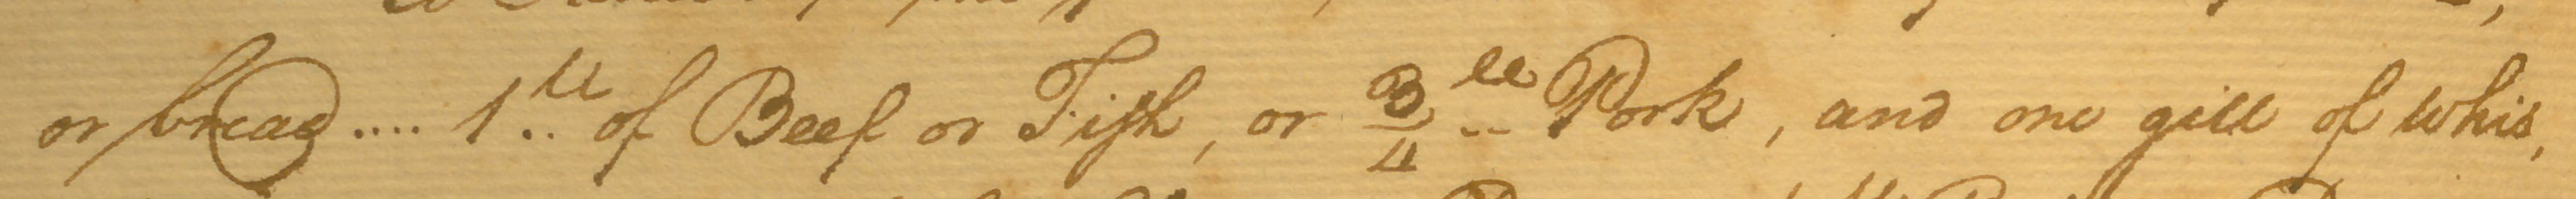or bread.... 1 ^lb. of Beef or Fish, or 3/4 ^lb. Pork, and one gill of whis-
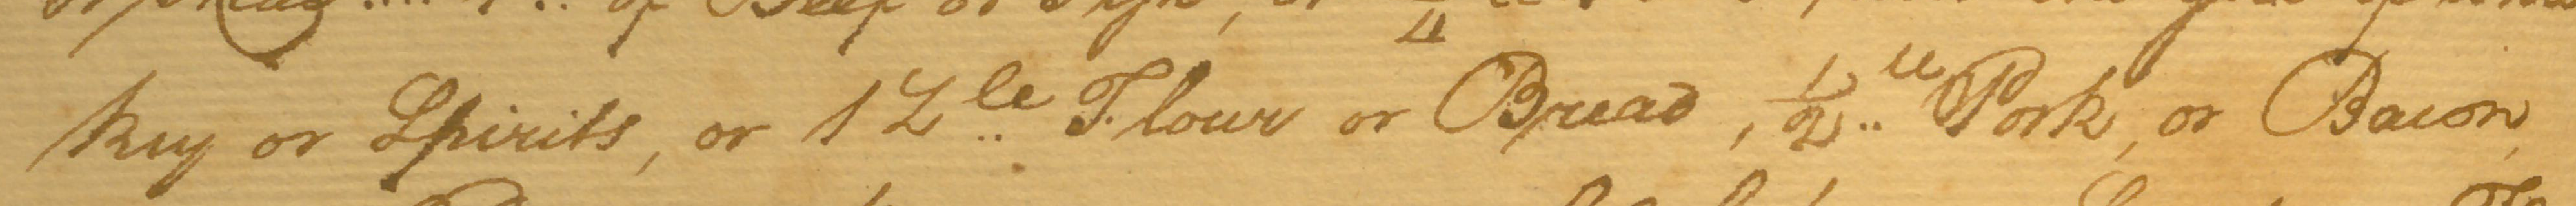key or spirits, or 1 1/2 ^lb. Flour or bread, 1/2 ^lb. Pork or Bacon,
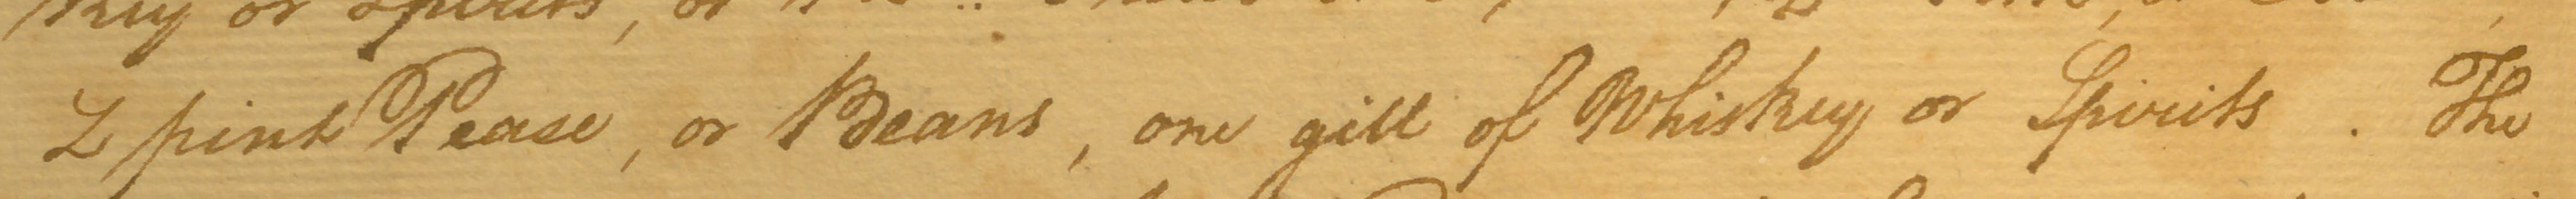1/2 pint Pease, or Beans, one gill of Whiskey or Spirits. The
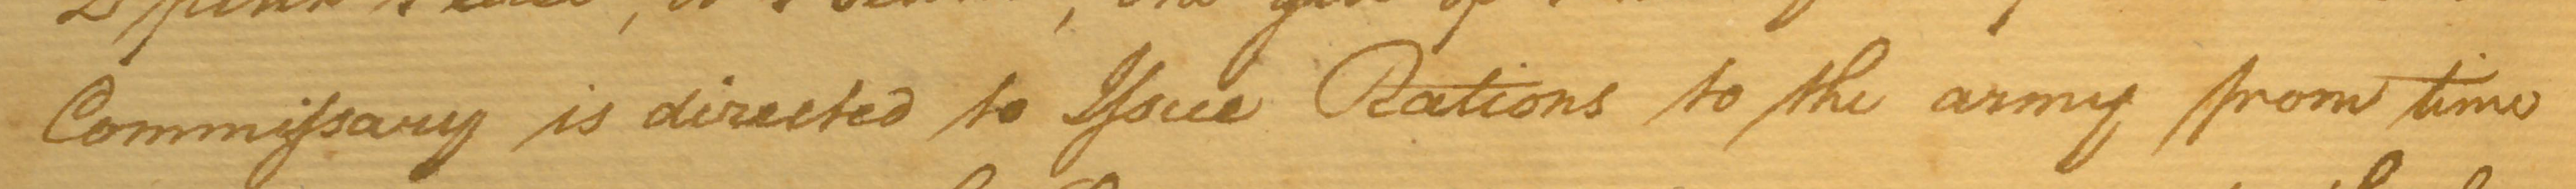Commissary is directed to Issue Rations to the army from time
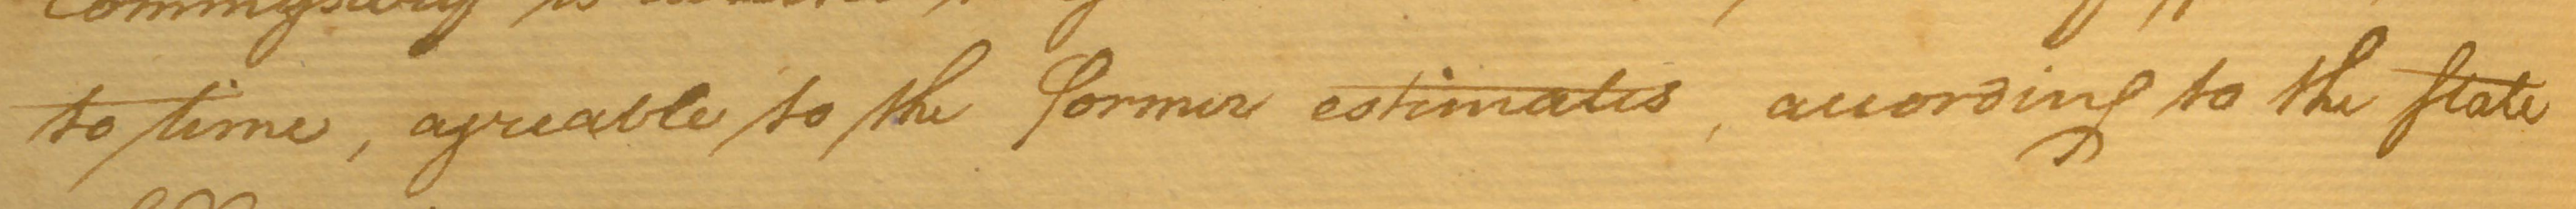to time, agreable to the former estimates, according to the state
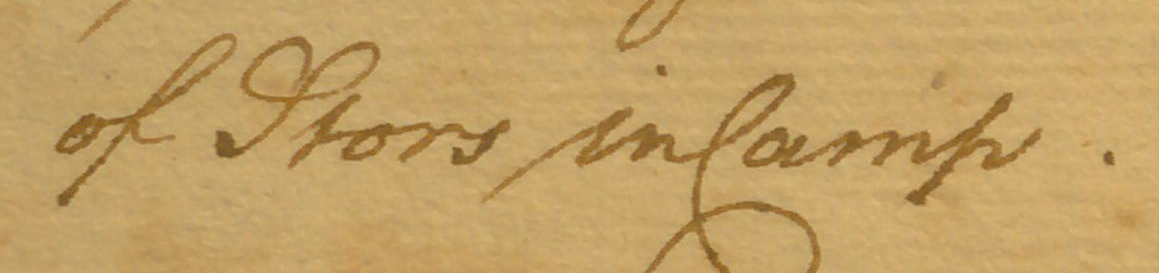of Stors in Camp.
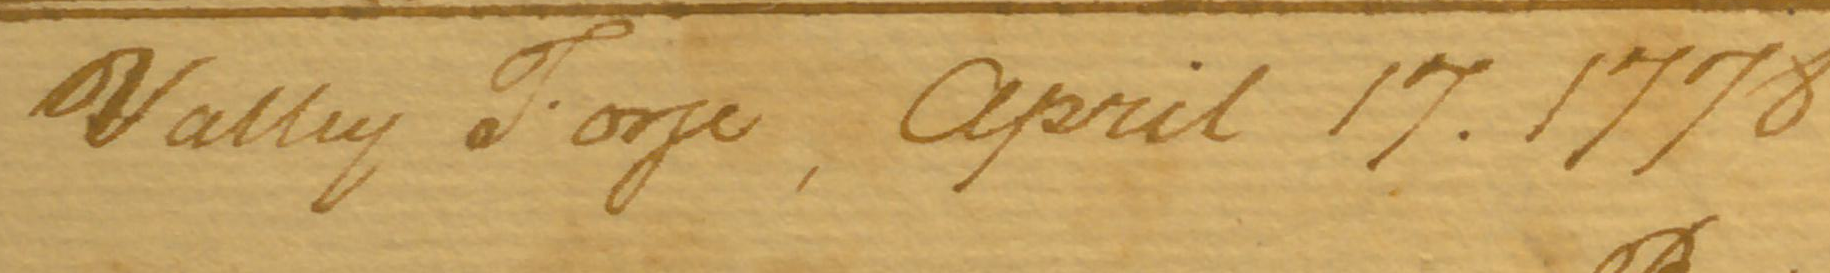Valley Forge, April 17. 1778
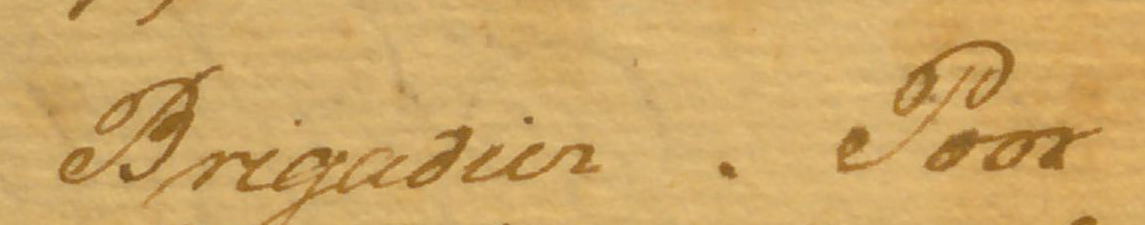Brigadier. Poor
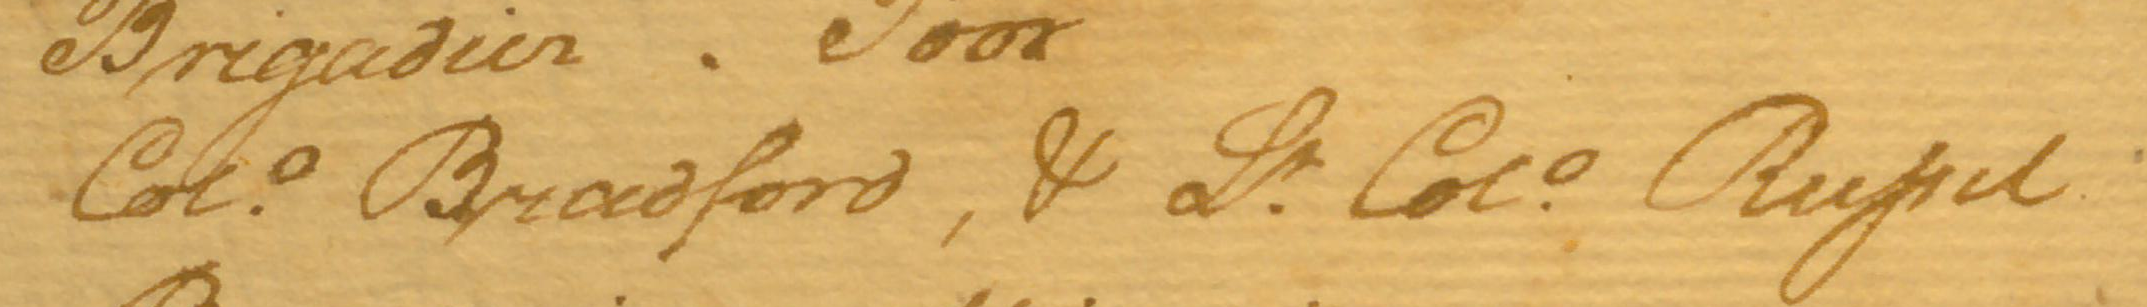Col^o. Bradford, & L^t. Col^o. Russel
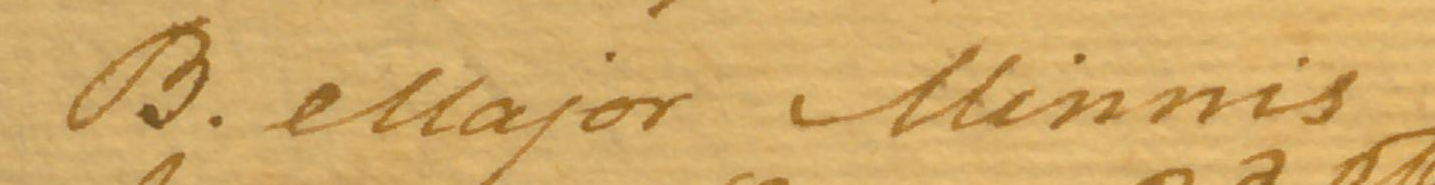B. Major Minnis
